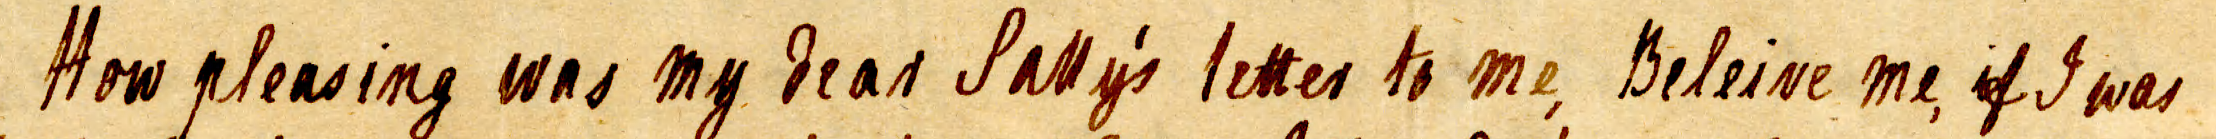How pleasing was my dear Sally's letter to me, Beleive me, if I was
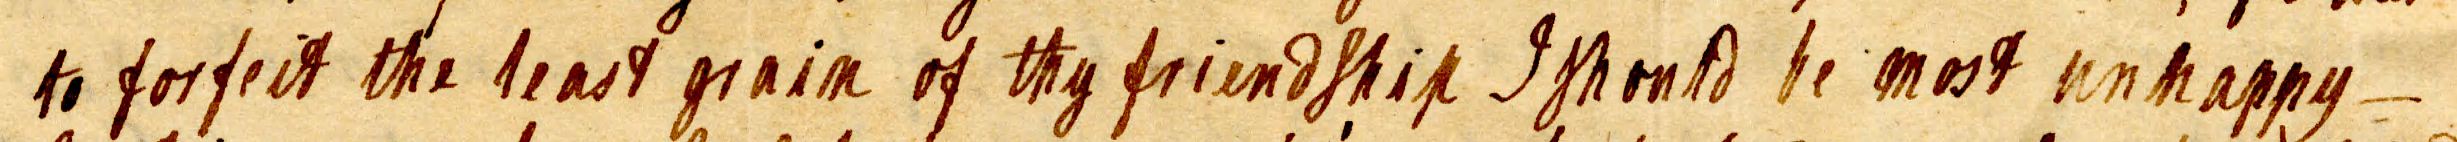to forfeit the least grain of thy friendship I should be most unhappy-
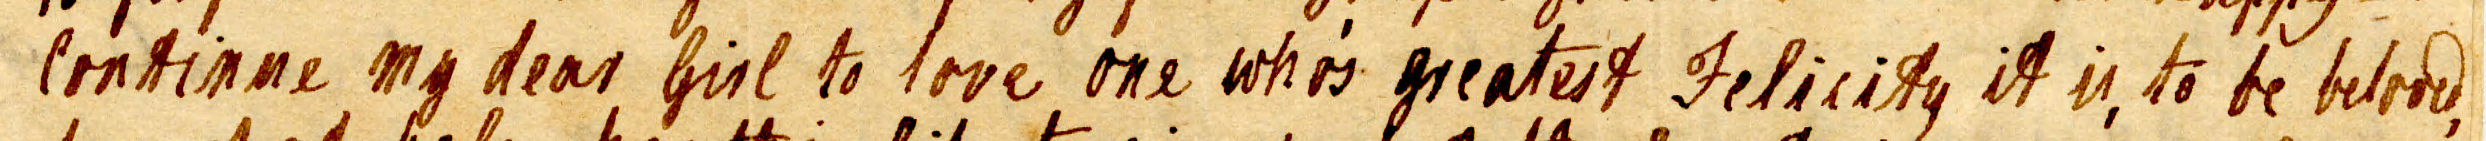continue my dear Girl to love one who's greatest Felicity it is, to be beloved,
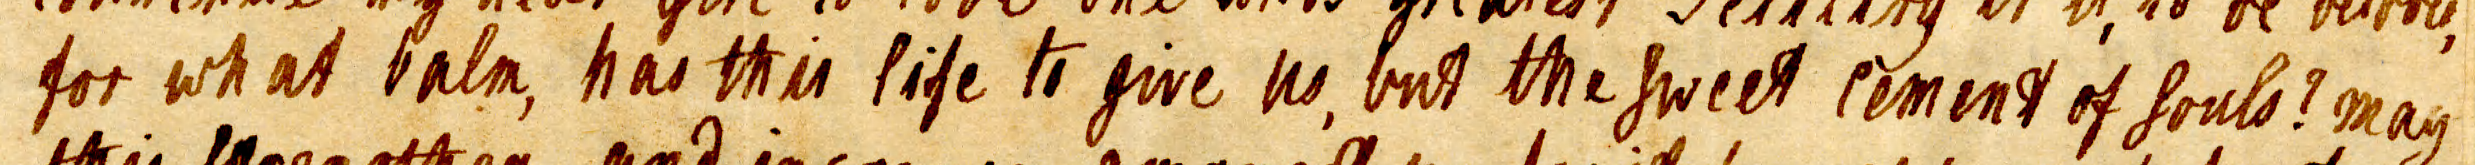for what balm, has this life to give us, but the sweet cement of souls? may
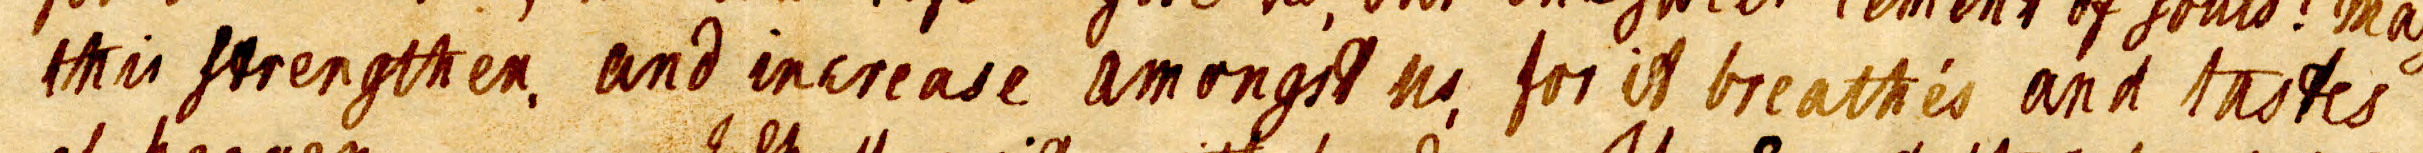this strengthen and increase amongst us for it breathes and tastes
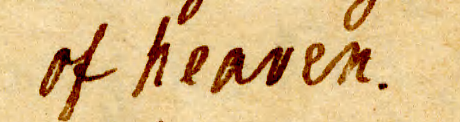of heaven.
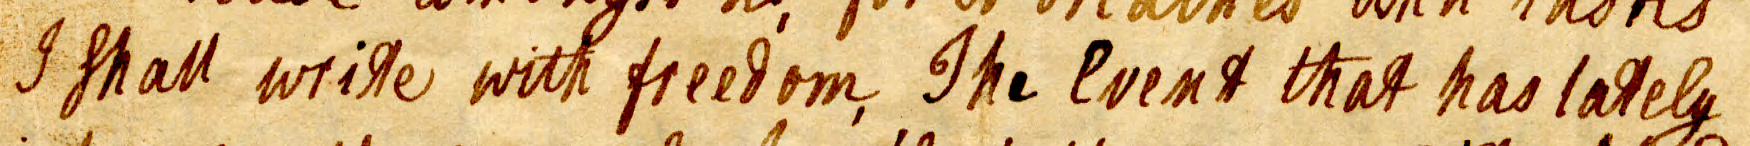I shall write with freedom, The event that has lately
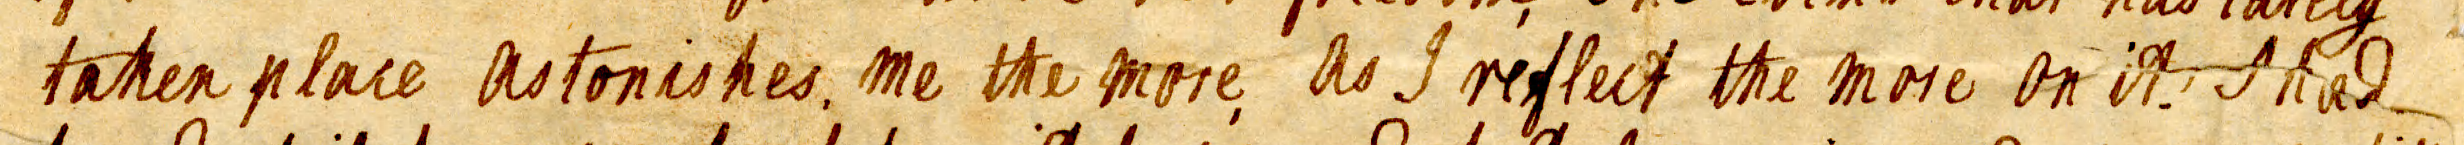taken place astonishes me the more, as I reflect the more on it. I had
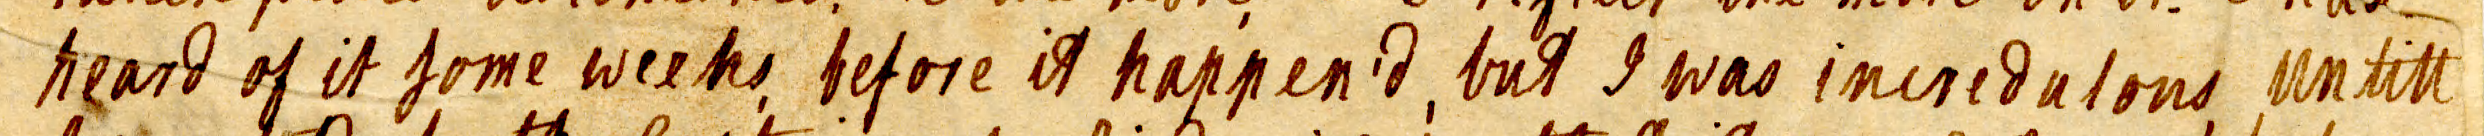heard of it some weeks before it happen'd, but I was incredulous untill
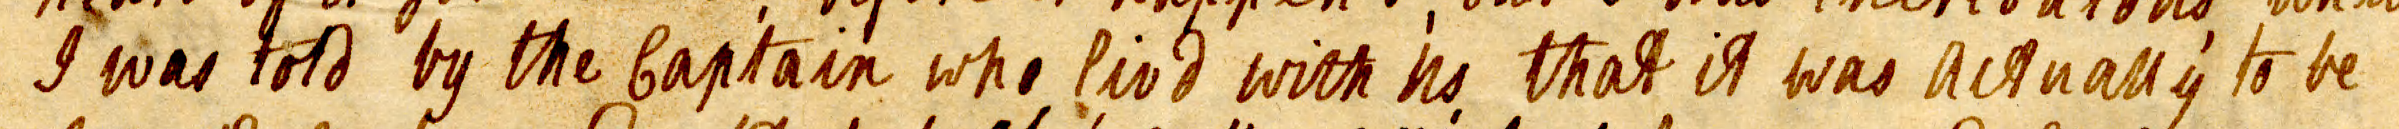I was told by the Captain who livd with us that it was actually to be
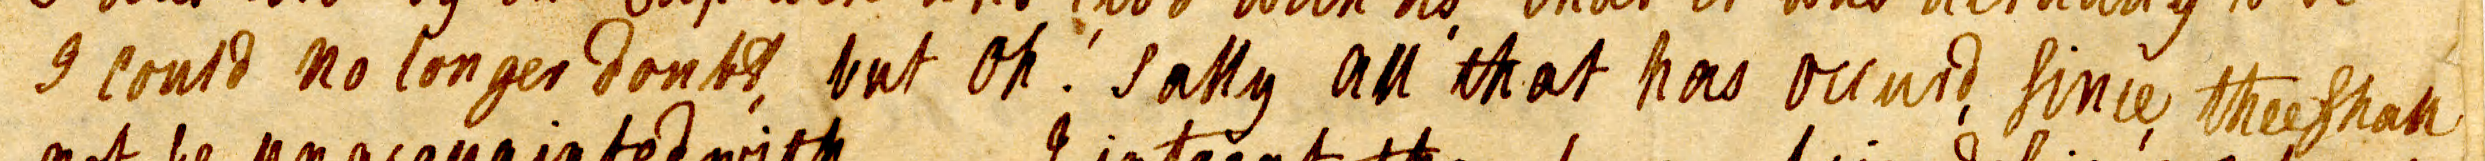I could no longer doubt, but Oh! Sally all that has occurd since thee shall
